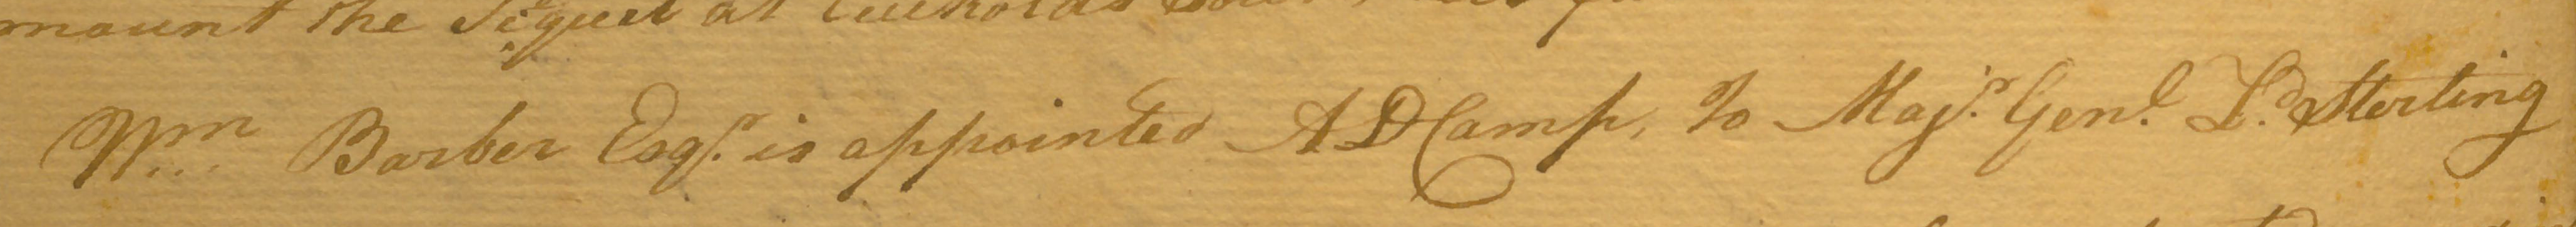M^r. Barber Esq^r. is appointed A D Camp to Maj^r. Gen^l. L^d. Sterling
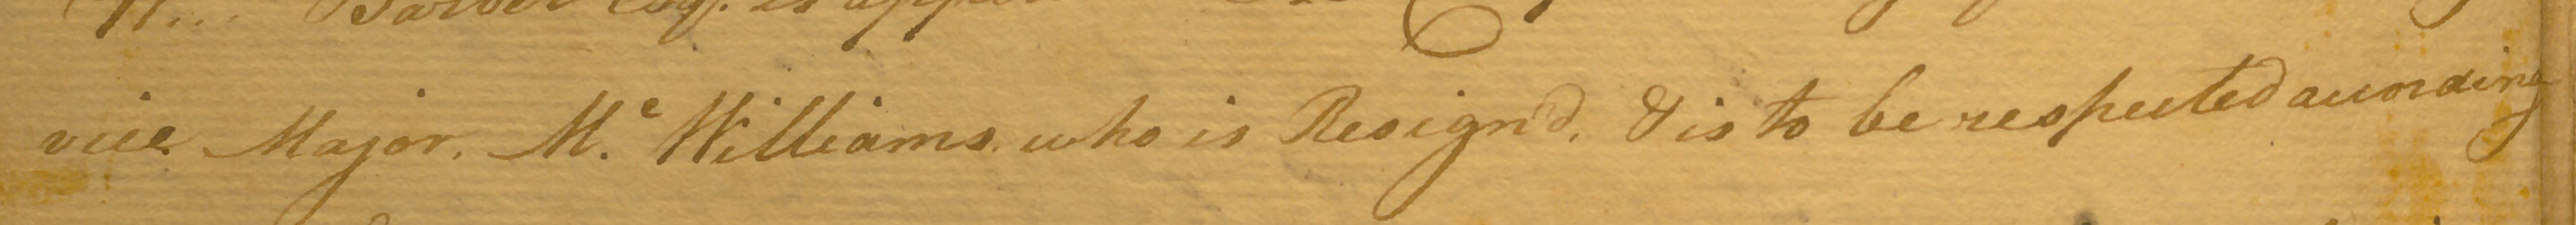vice major M^c.Williams who is Resign'd & is to be respected according
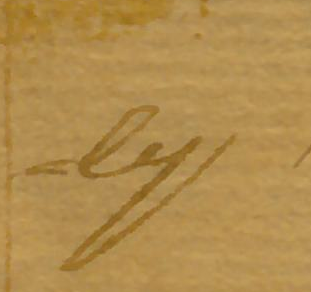-ly
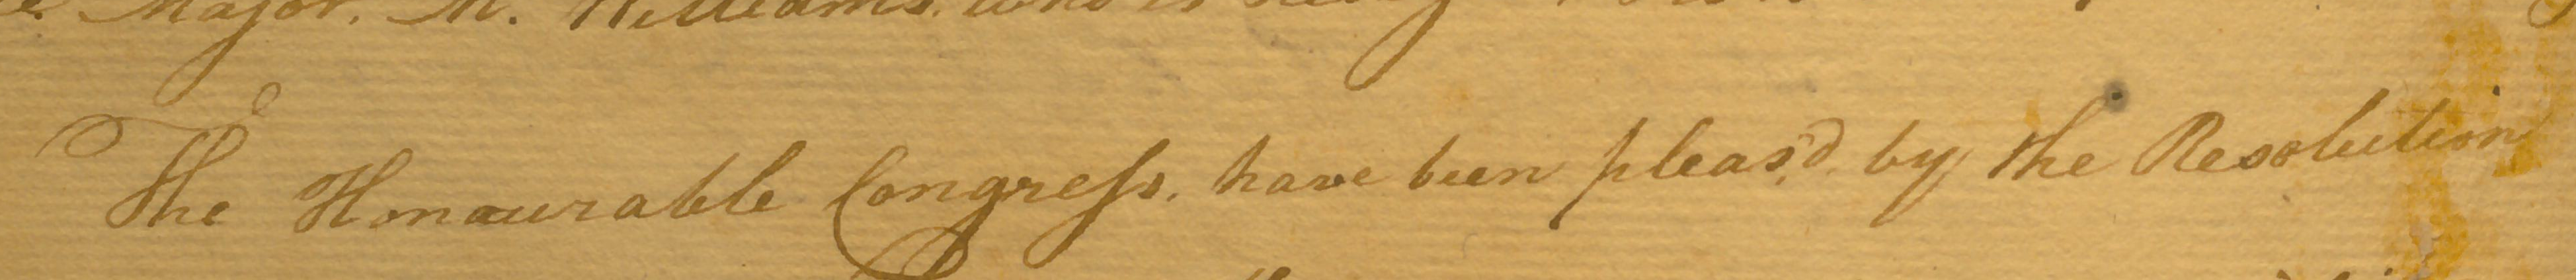The Honourable Congress have been pleas'd by the Resolution
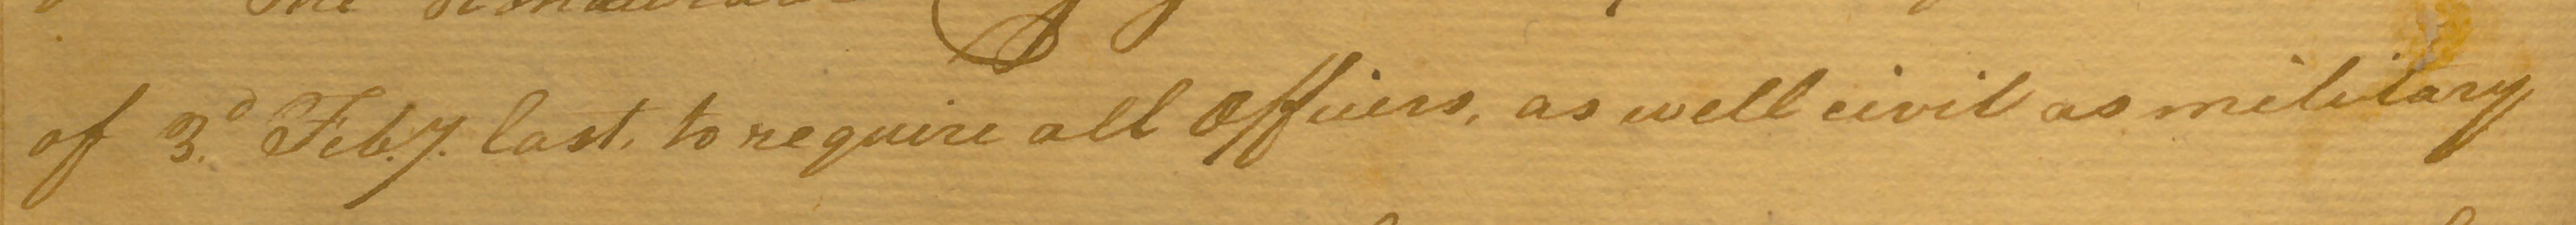of 3^d. Feb^y last to require all officers, as well civil as military
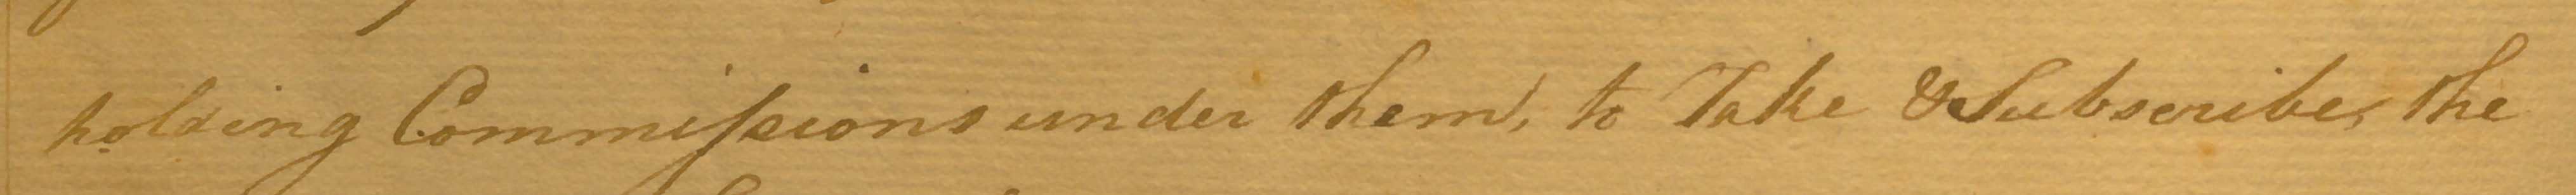holding Commissions under them to Take & Subscribe the
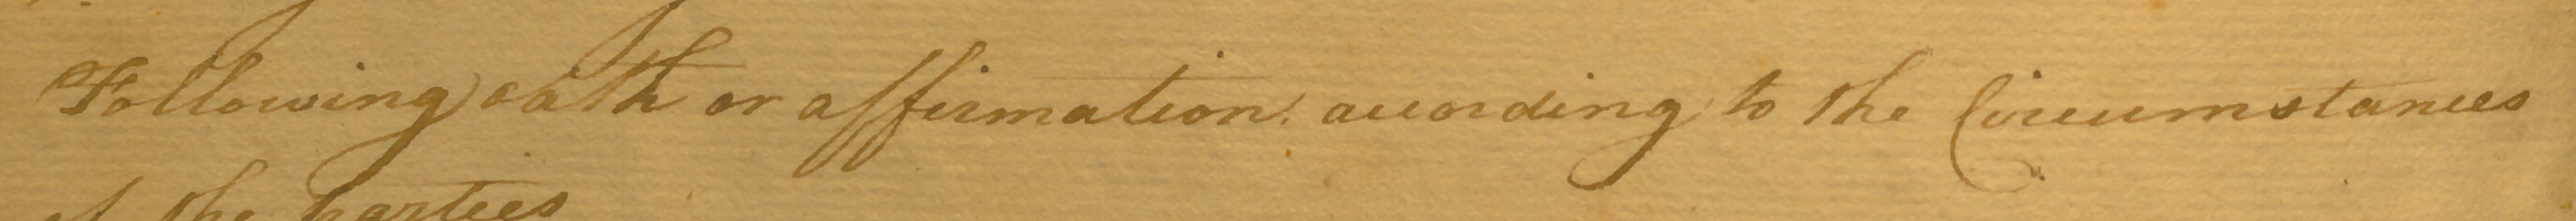Following oath or affirmation according to the Circumstances
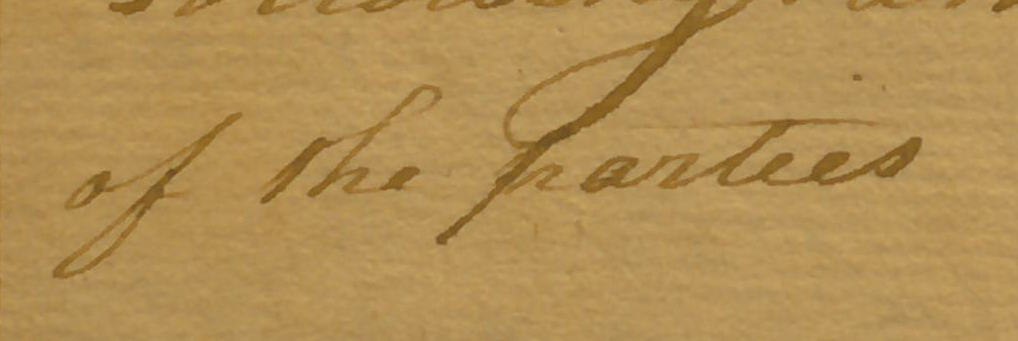of the parties
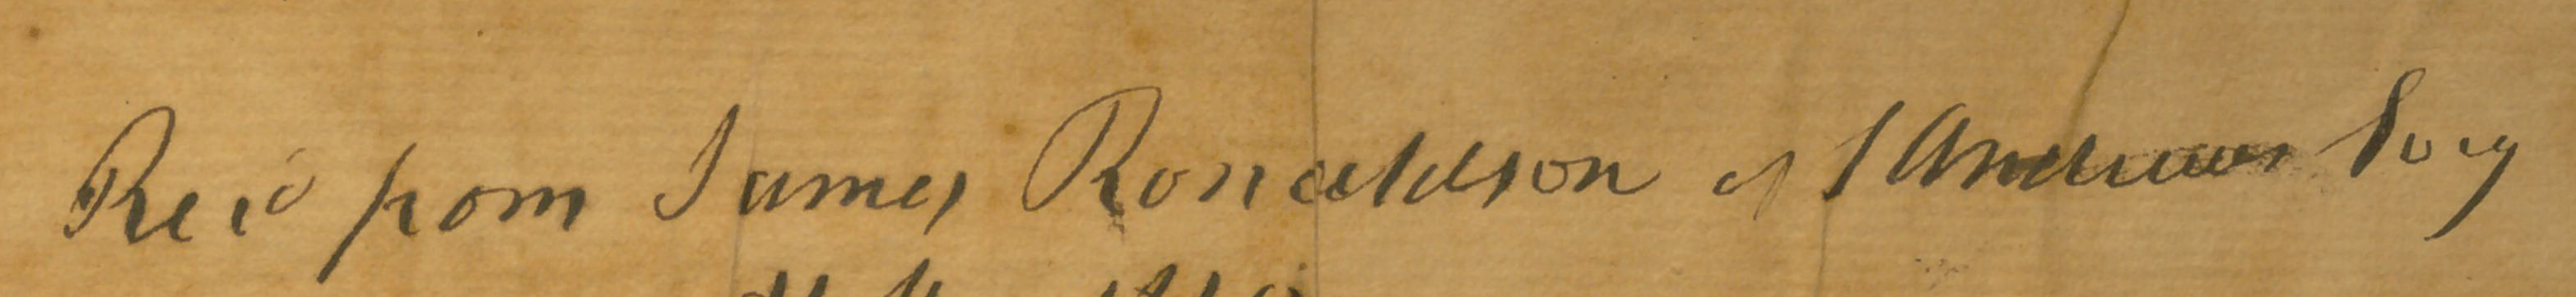Rec'd from James Ronaldson of 1 American Socy
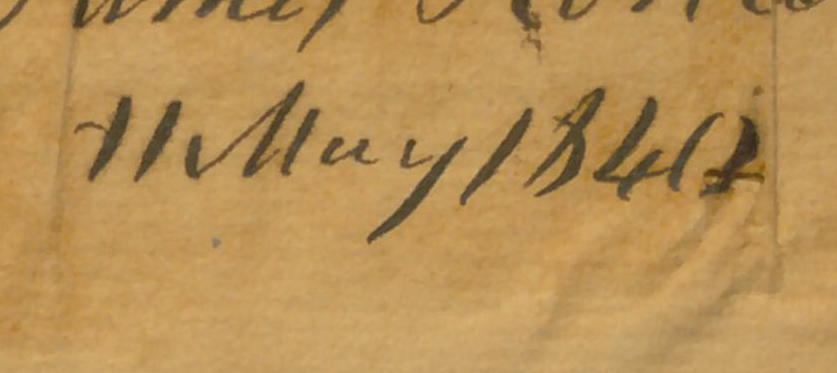11 May 1842
